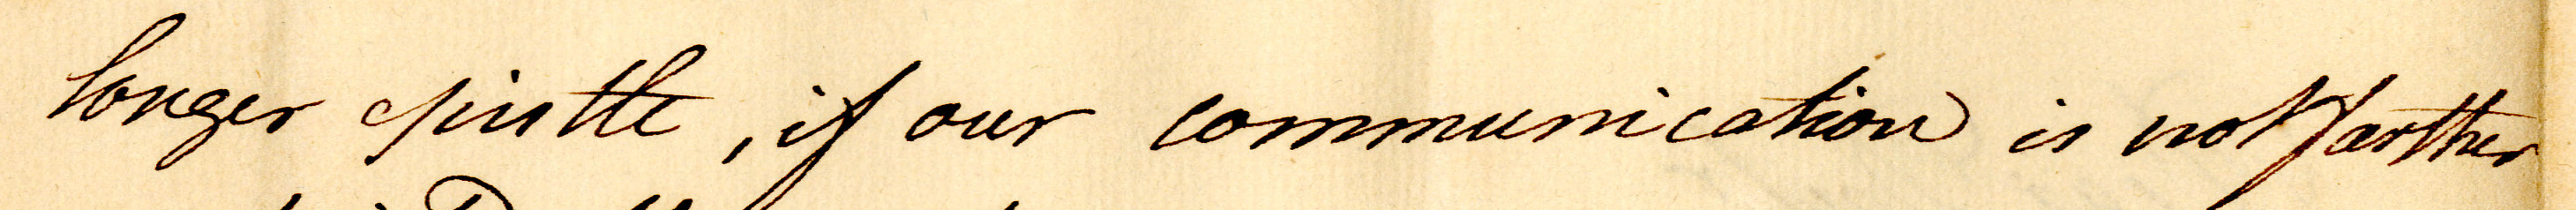longer epistle, if our communication is not farther
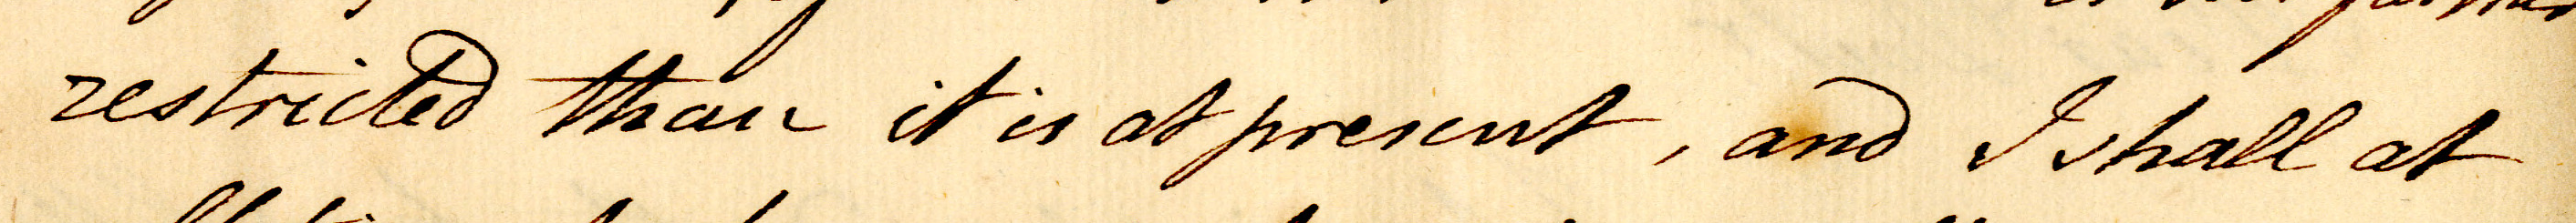restricted than it is at present, and I shall at
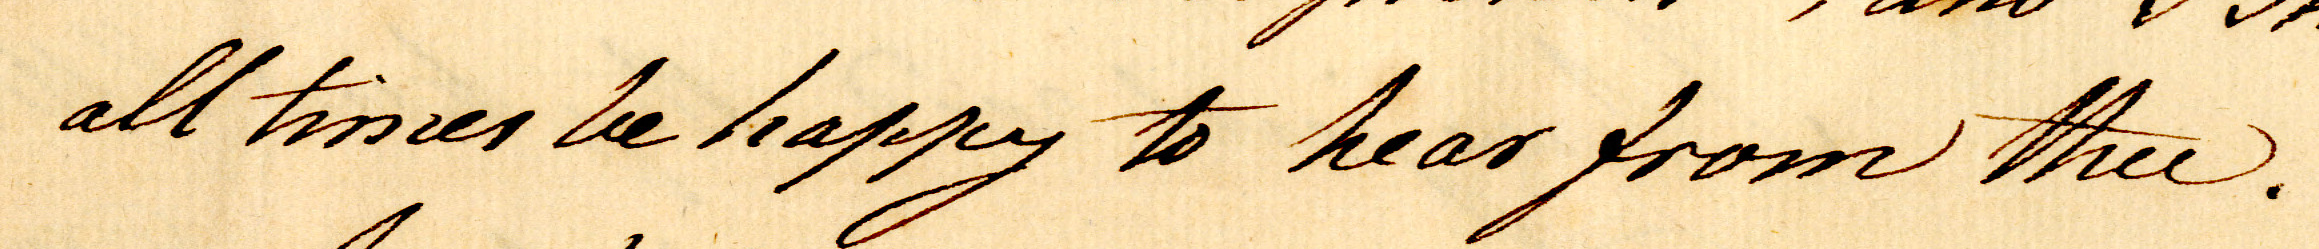all times be happy to hear from thee.
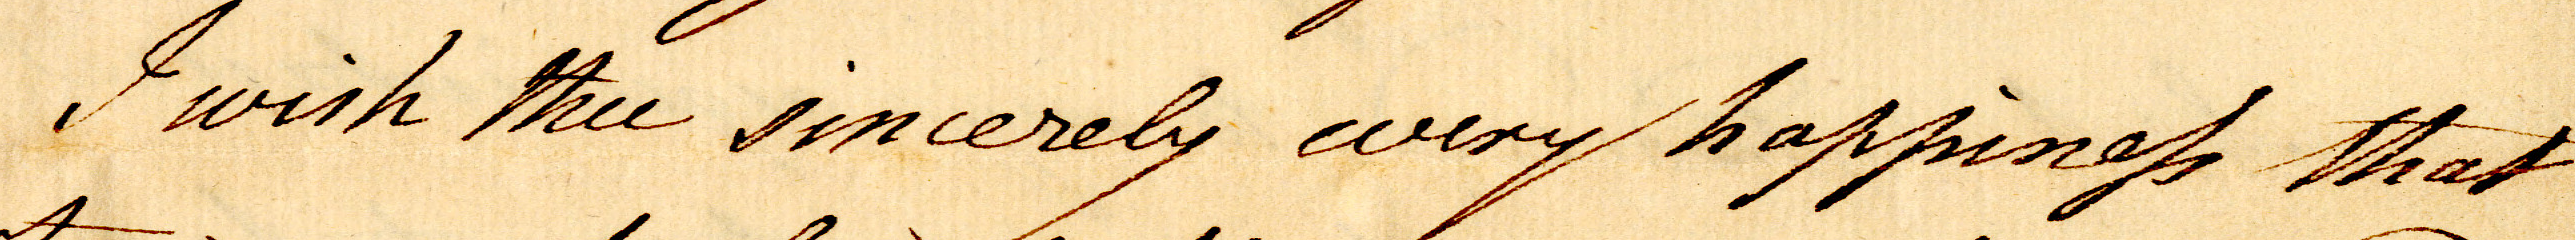I wish thee sincerely every happiness that
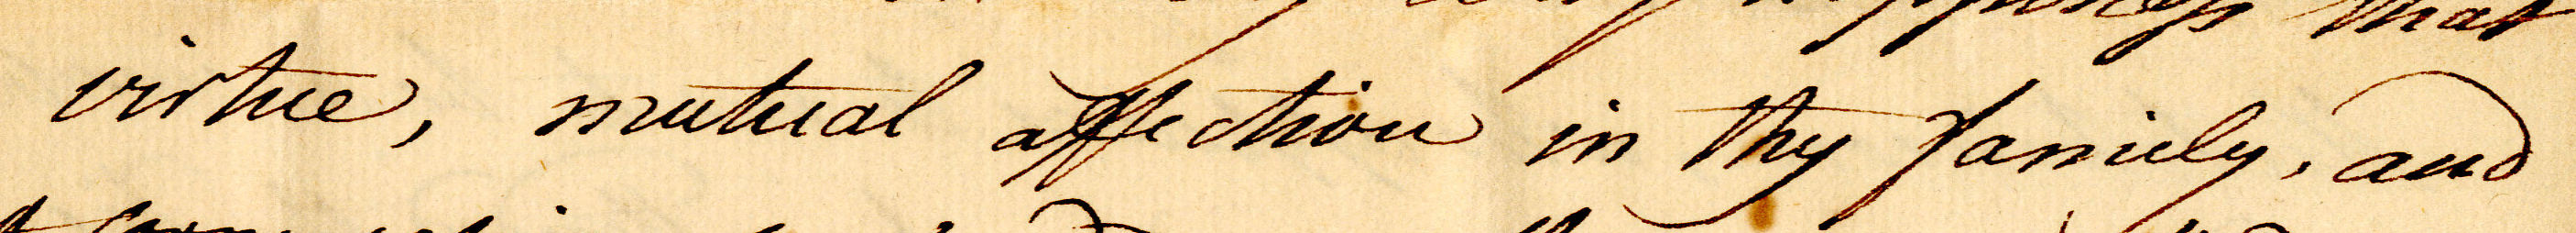virtue, mutual affection in thy family, and
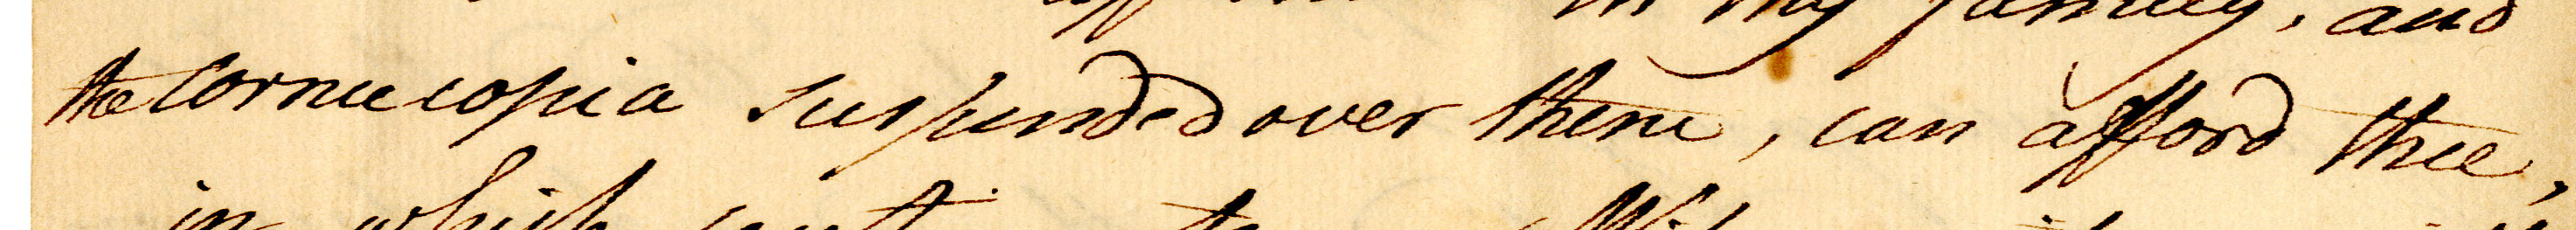the cornucopia suspended over them, can afford thee,
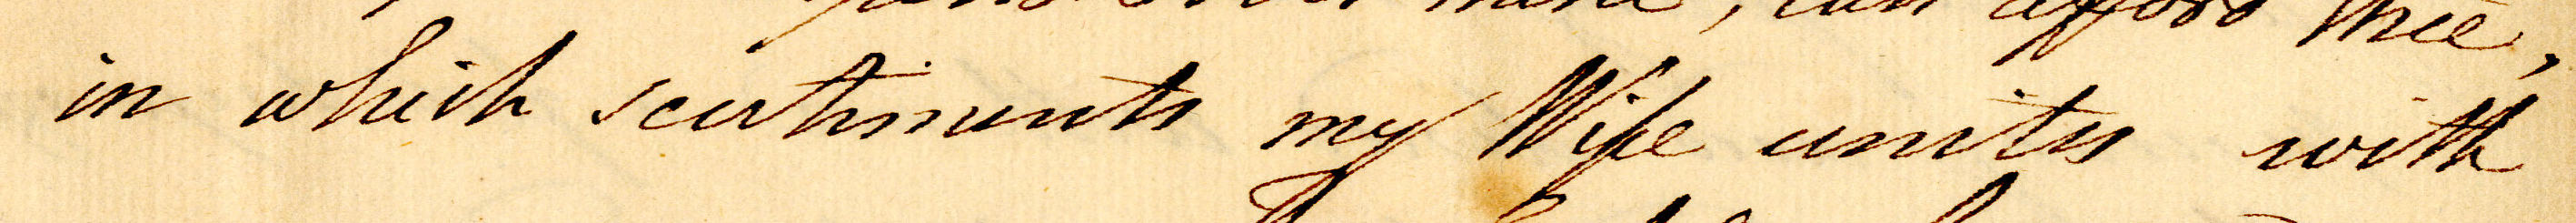in which sentiments my Wife unites with
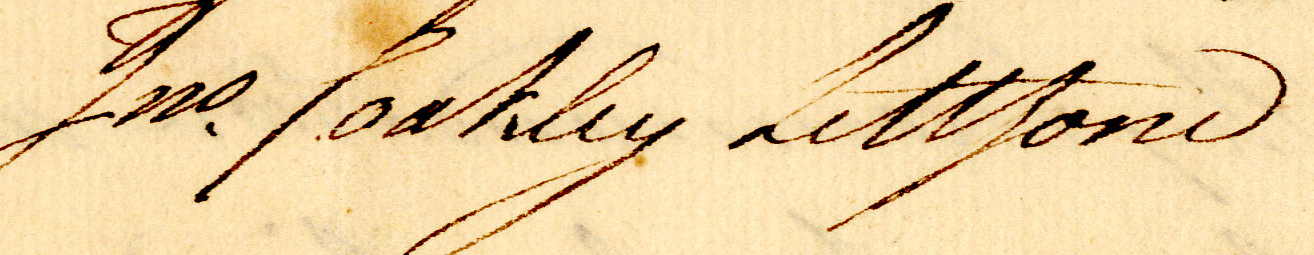Jno. Coakley Lettsom
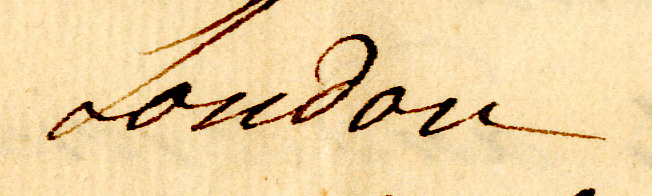London
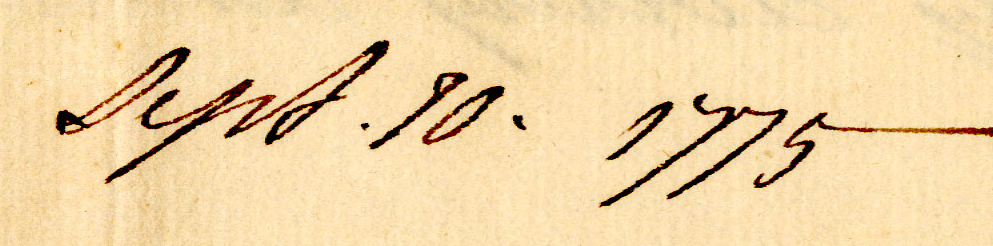Sept. 10. 1775
